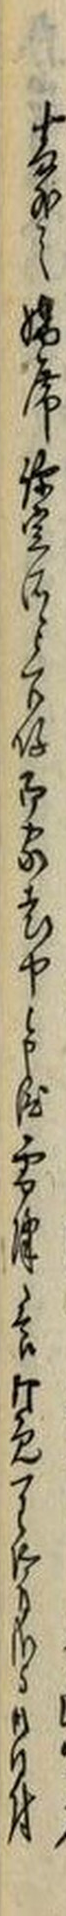番外之嫡席評定所へ被召呼御家老中被申渡雪降候節御免可被仰付哉と御目付
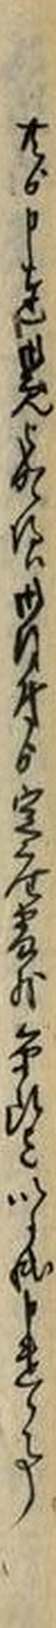共ゟ申達御免被成候得は御目付ゟ定座番外筆頭迄以手紙申遣候事
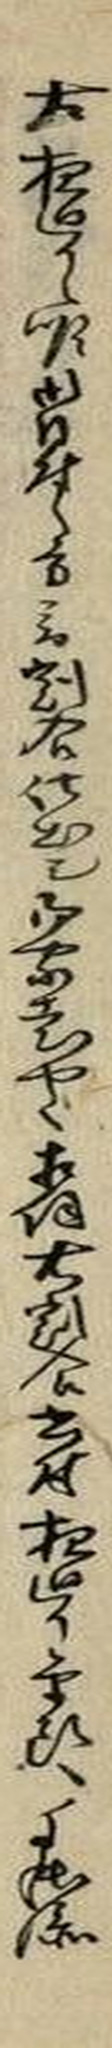右夜廻り之順御目付之方にて割合仕出シ御家老中へ相伺右割合書付夜廻り筆頭へ手紙添
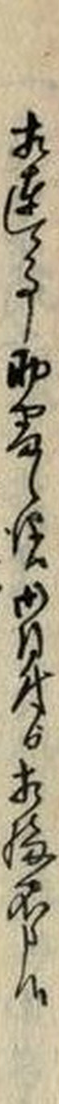相達候事助番之儀は御目付ゟ相構不申候
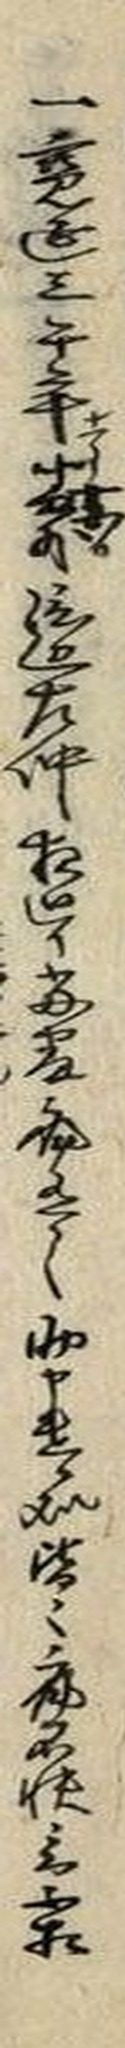一寛延三午年十一月廿五日番外渡辺左仲夜廻り当番痛有之助申遣候処皆々痛不快にて不相
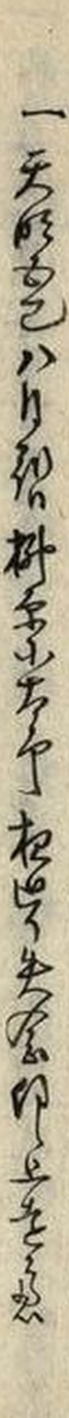一天明五巳八月朔日榊原小太郎夜廻り失念伺之上遠慮
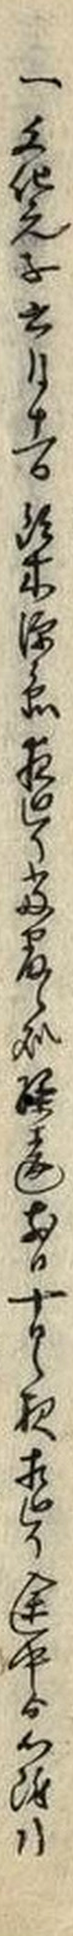一文化元子六月十一日鈴木源兵衛夜廻り当番之処繰違前日十日之夜相廻り途中ゟ心附引
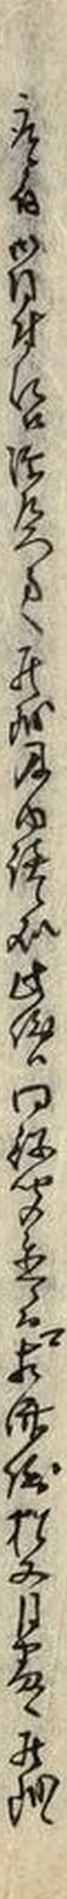取候に付御目付江口弥左衛門方へ罷越及内談候処此儀は同役聞置候て可相済儀猶又月番へ罷越候
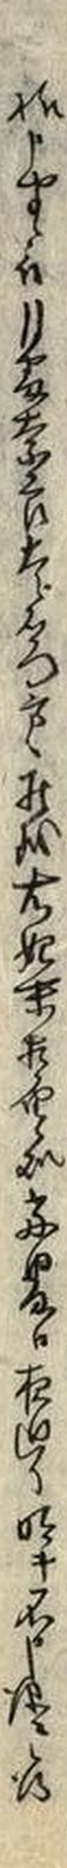様申聞候に付月番奈良太郎右衛門方へ罷越右始末相届候処当番日夜廻り明キ不申儀に候得
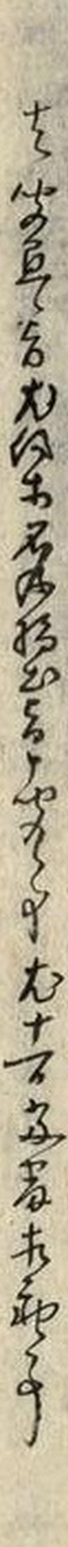は聞置候旨尤伺等不及指出旨申聞候事尤十一日当番相勤候事
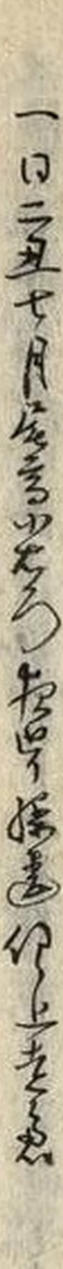一同二丑七月尾高小右衛門夜廻り繰違伺之上遠慮
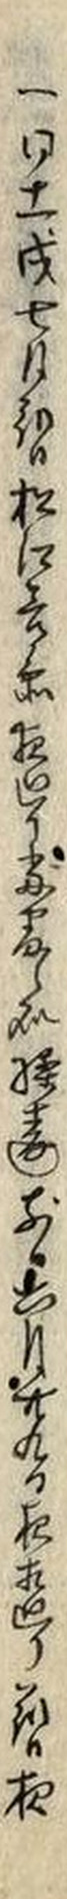一同十一戌七月朔日松江善兵衛夜廻り当番之処繰違前日六月廿九日夜相廻り朔日夜
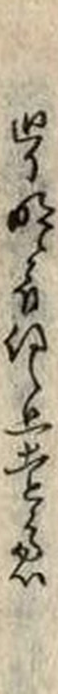廻り明候に付伺之上遠慮
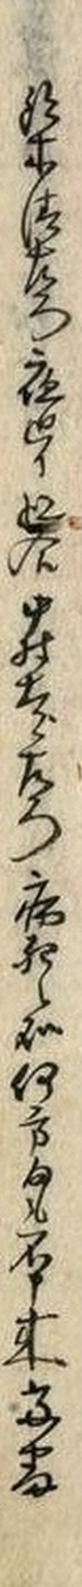一鈴木清左衛門夜廻り組合中村太郎左衛門病死之処何方ゟも不申来当番
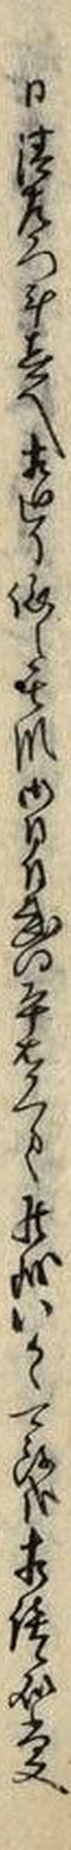日清左衛門斗壱人相廻り依之其段御目付武田平右衛門方へ罷越いかゝ可致哉相談候処尚又

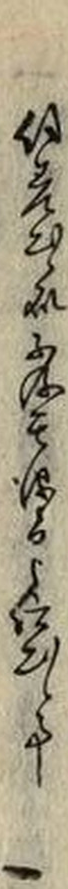伺差出候処不及其儀旨被仰出候事
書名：御城下諸事之部
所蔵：福井県文書館 Fukui Prefectural Archives
